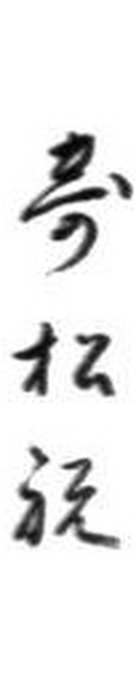寄松祝
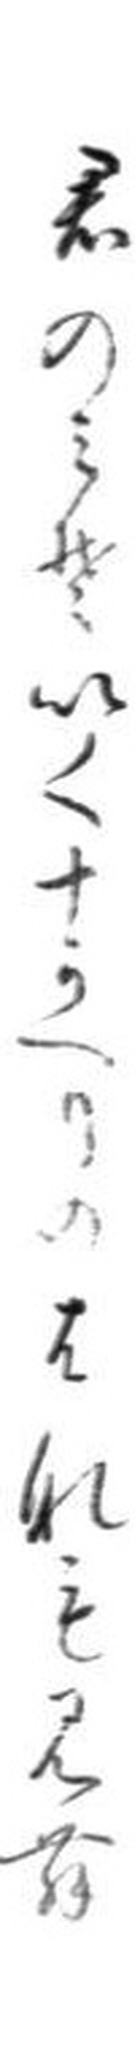君のみそいく十かへりのはなも見む
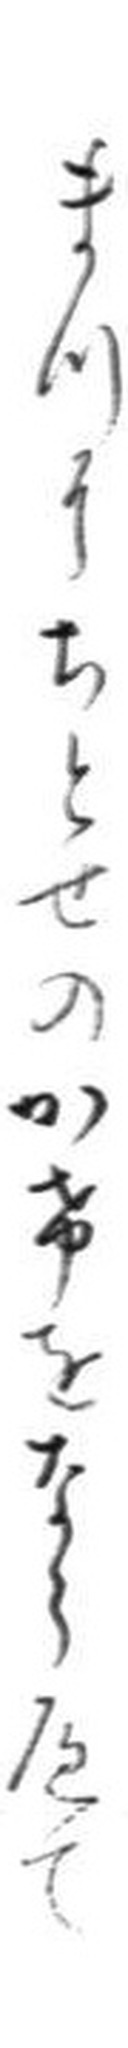まつにちとせのかけをならへて
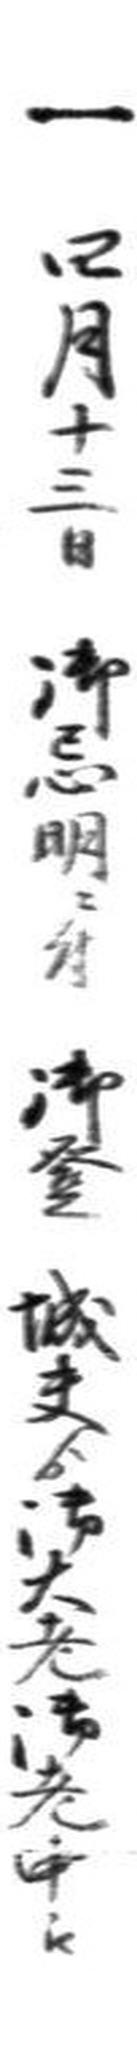一四月十三日御忌明ニ付御登城夫ゟ御大老御老中江
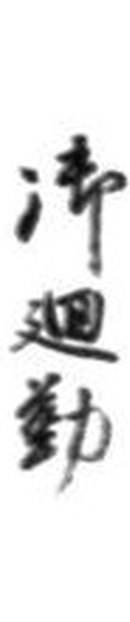御廻勤

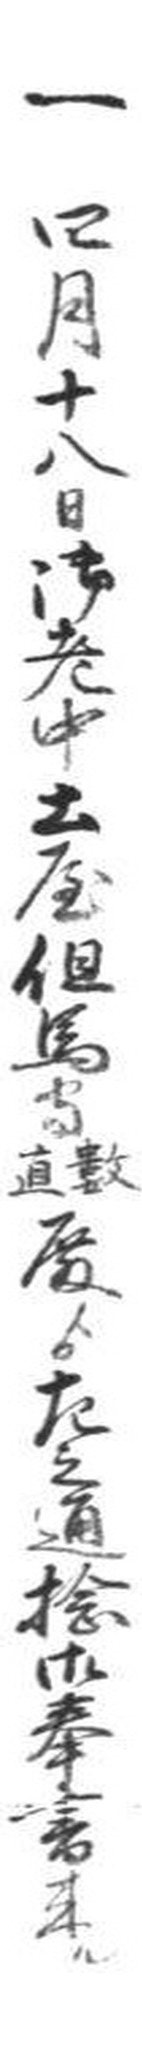一四月十八日御老中土屋但馬守数直殿ゟ左之通捻御奉書来ル
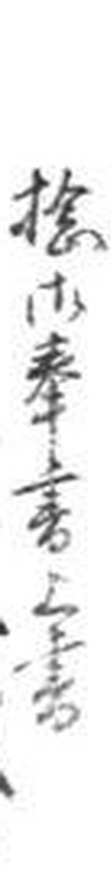捻御奉書上書
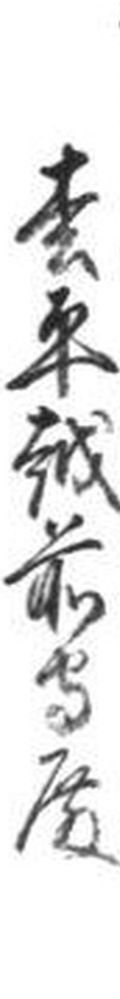松平越前守殿数直
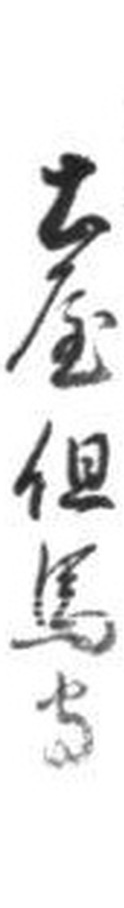土屋但馬守
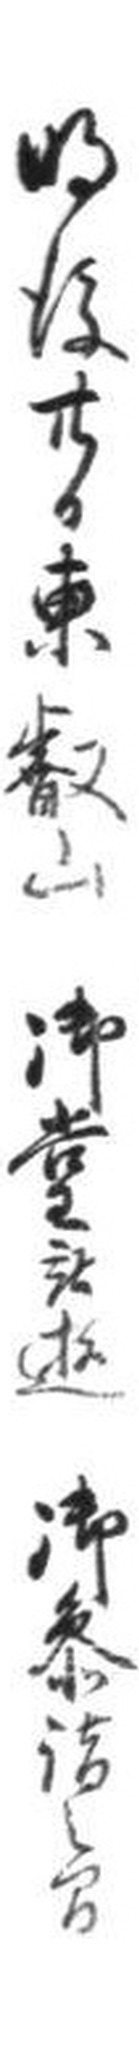明後廿日東叡山御堂被遊御参詣之間
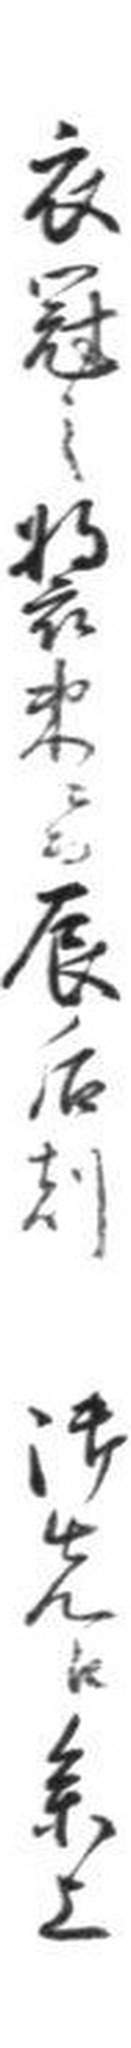衣冠之装束ニ而辰后刻御先江参上
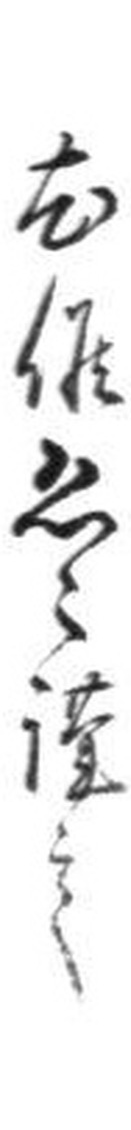尤候恐々謹言
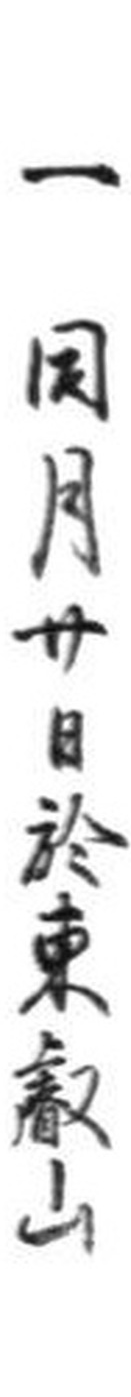一同月廿日於東叡山
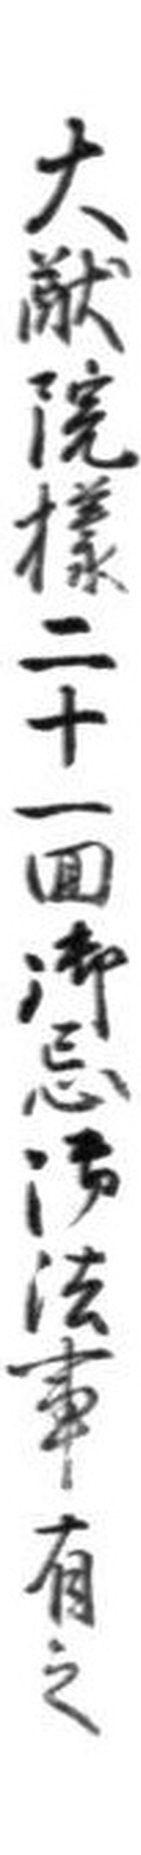大猷院様二十一回御忌御法事有之
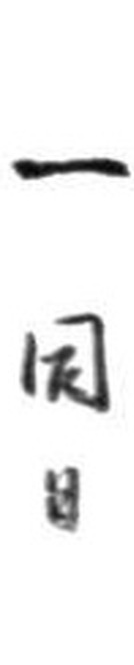一同日
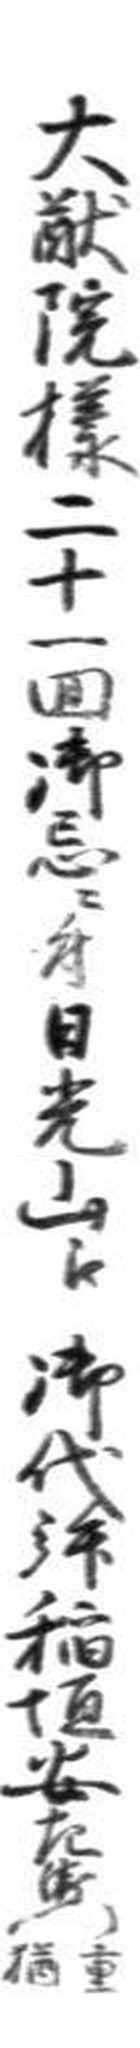大猷院様二十一回御忌ニ付日光山江御代拝稲垣安左衛門重猶
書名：家譜 八 光通公 従寛文十年到同十二年
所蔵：福井県文書館 Fukui Prefectural Archives
